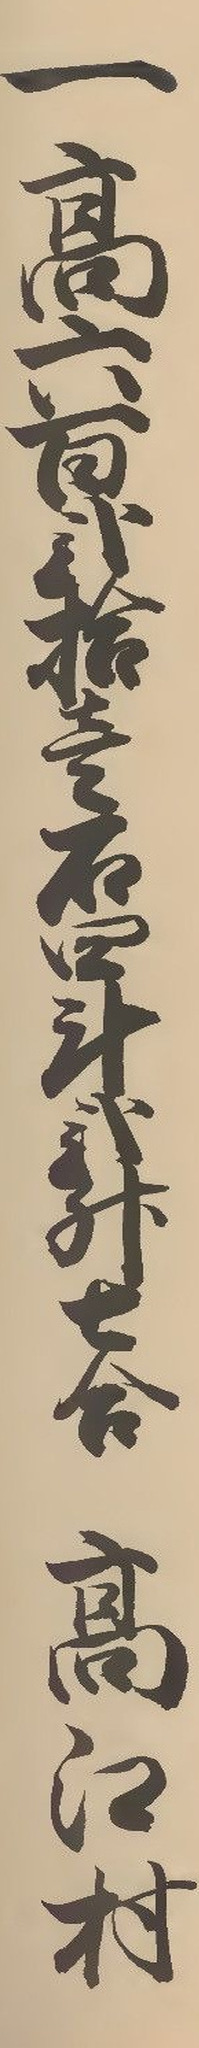一髙六百弐拾壱石四斗弐升七合髙江村
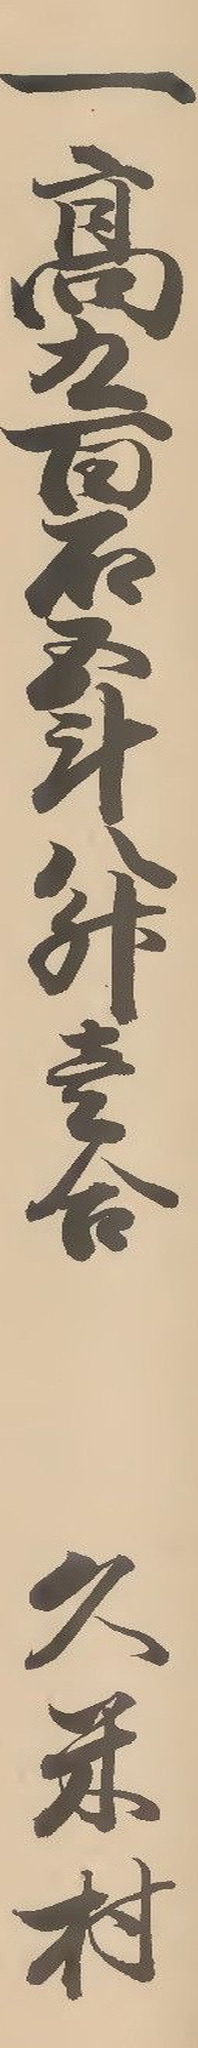一髙九百石五斗八升壱合久米村
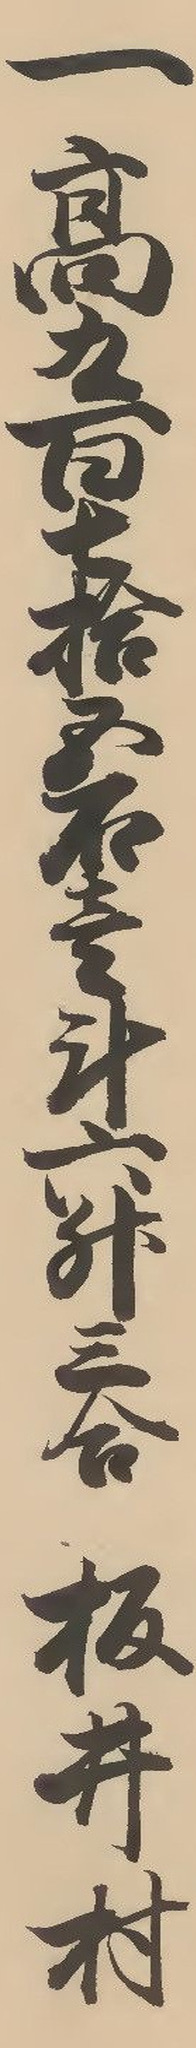一髙九百七拾五石壱斗六升三合板井村
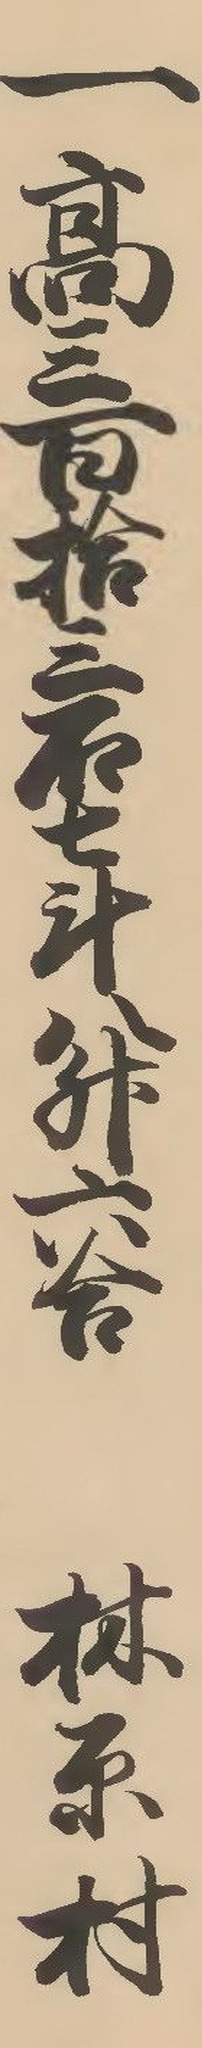一髙三百拾三石七斗八升六合林原村
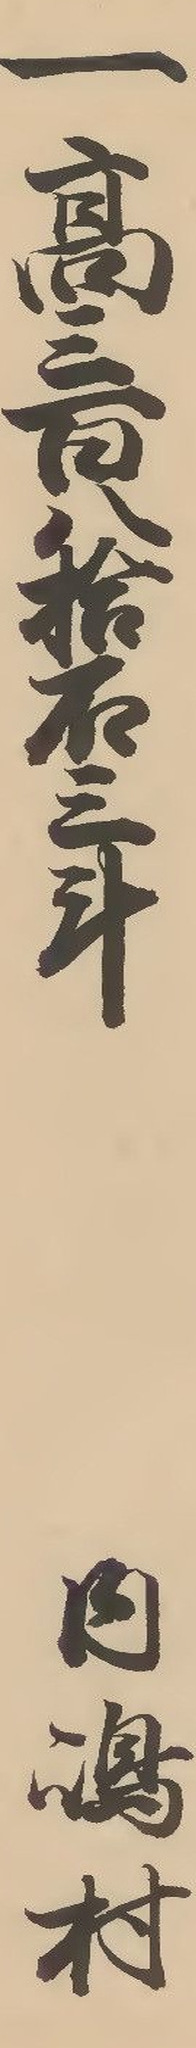一髙三百八拾石三斗内嶋村

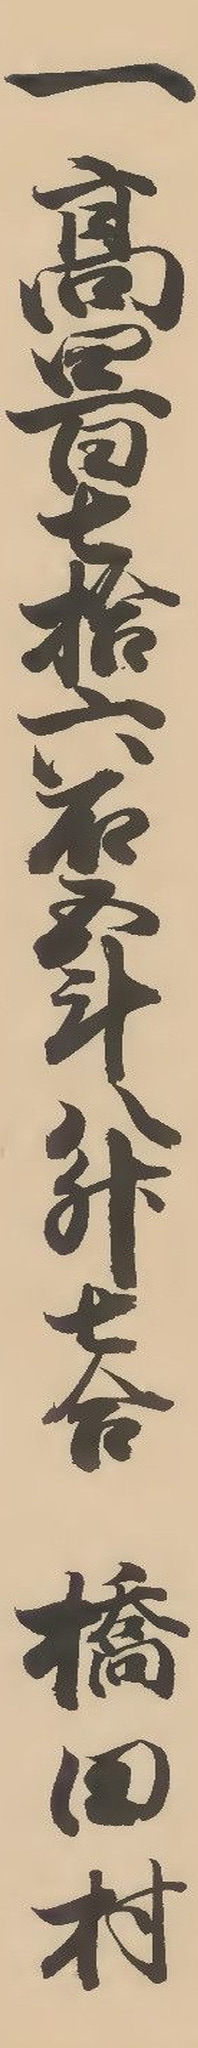一髙四百七拾六石五斗八升七合橋田村
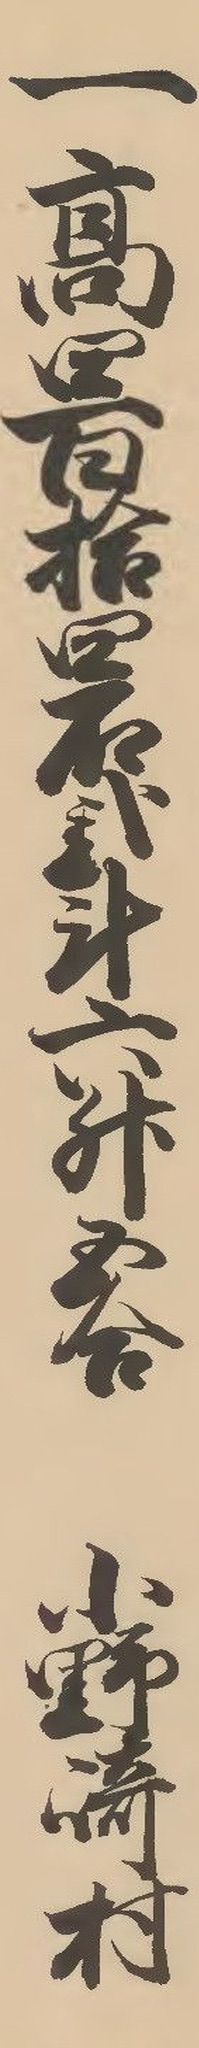一髙四百拾四石弐斗六升五合小野崎村
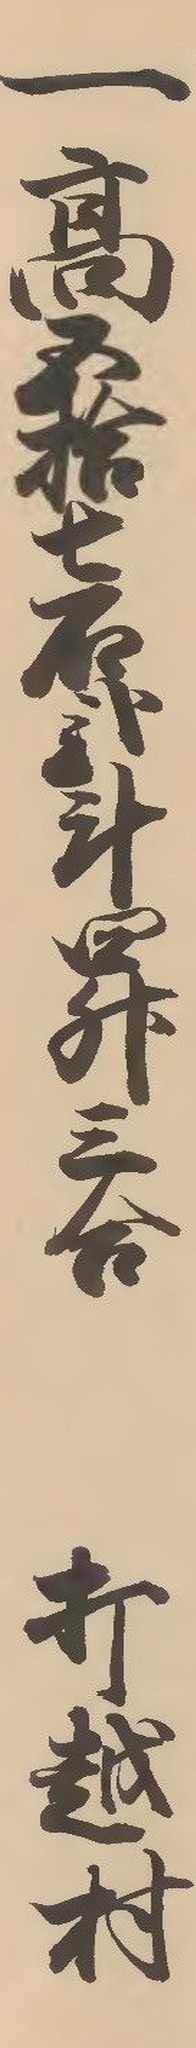一髙五拾七石弐斗四升三合打越村
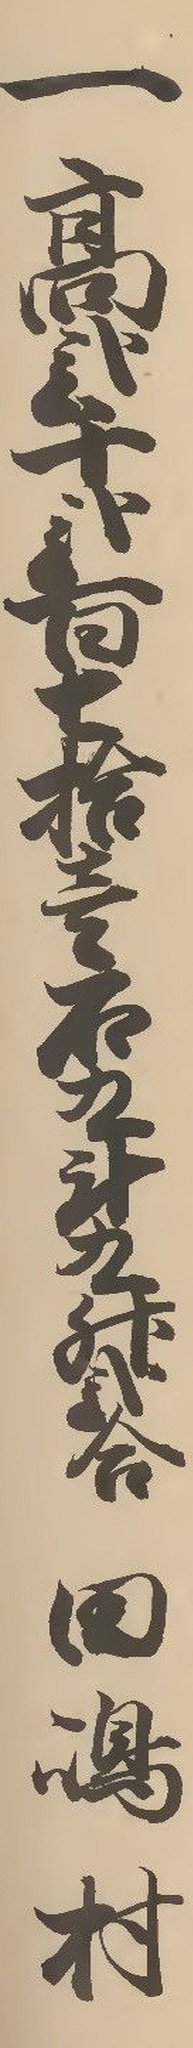一髙弐千弐百七拾壱石九斗九升弐合田嶋村
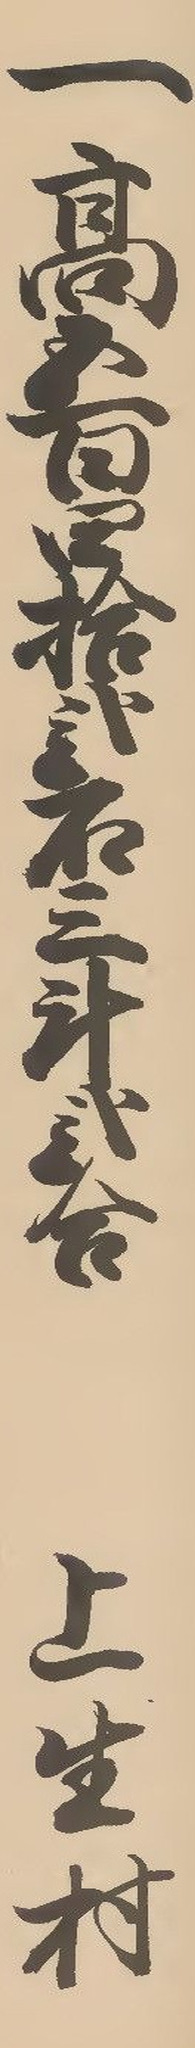一髙五百四拾弐石三斗弐合上生村
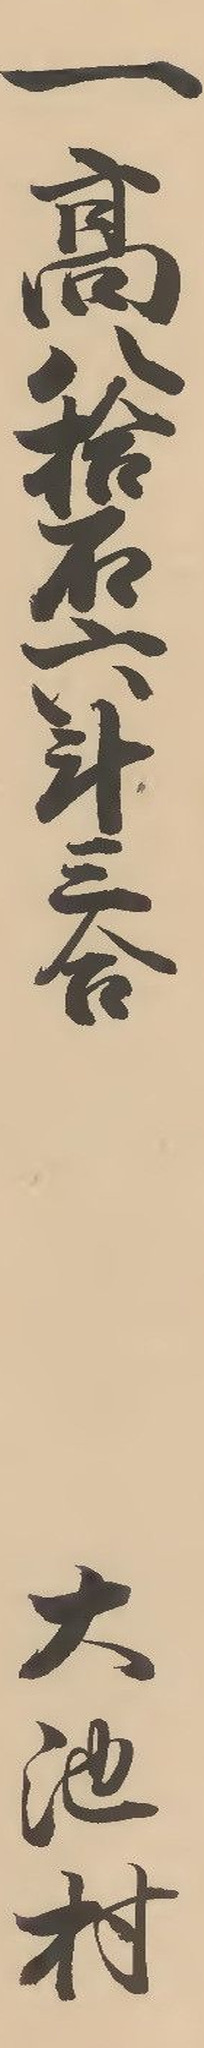一髙八拾石六斗三合大池村
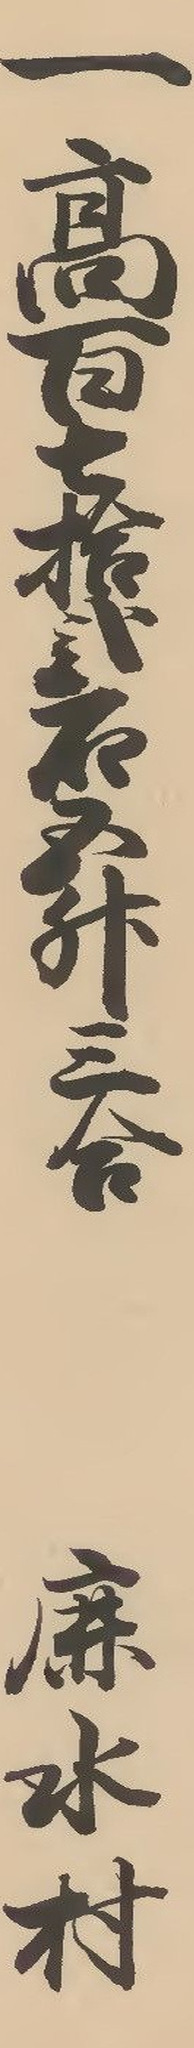一髙百七拾弐石五升三合鹿水村

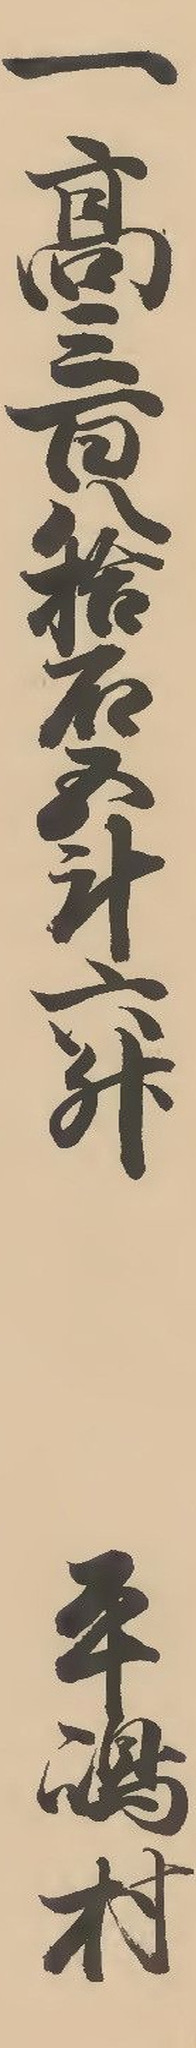一髙三百八拾石五斗六升平嶋村
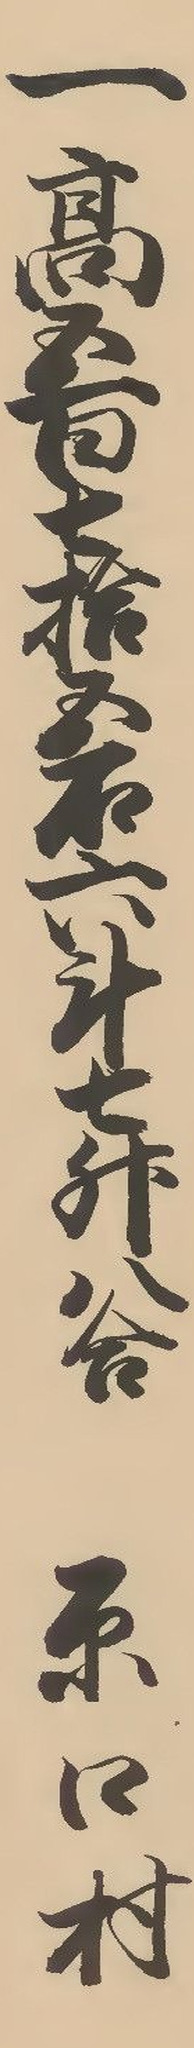一髙五百七拾五石六斗七升八合原口村
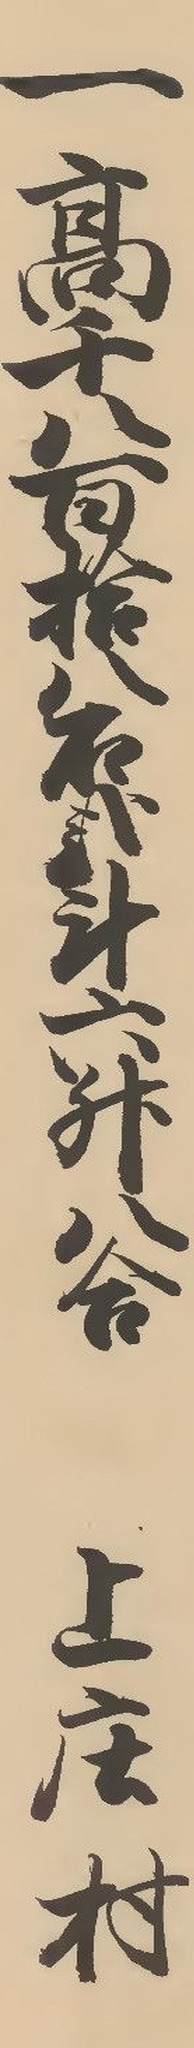一髙千八百拾八石弐斗六升八合上庄村
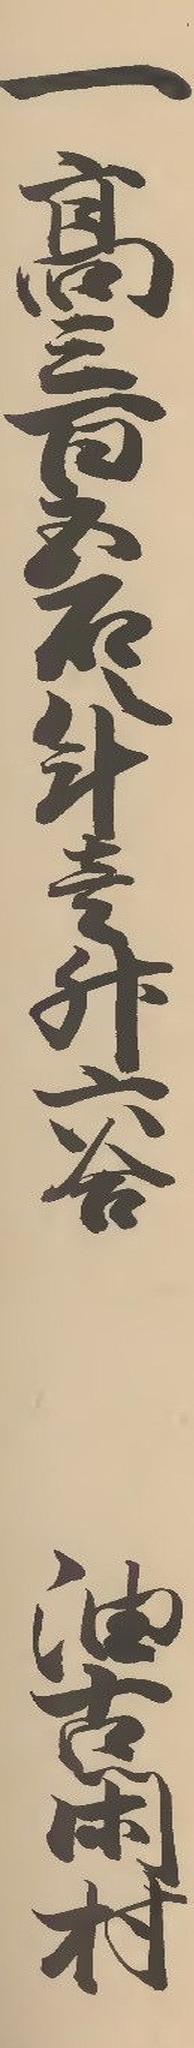一髙三百五石八斗壱升六合油古閑村
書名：肥後国郷帳
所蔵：国立公文書館 National Archives of Japan
